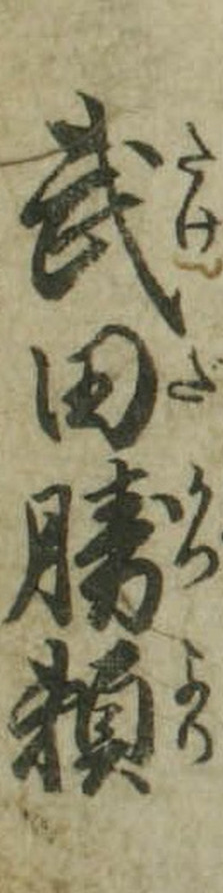武田勝頼

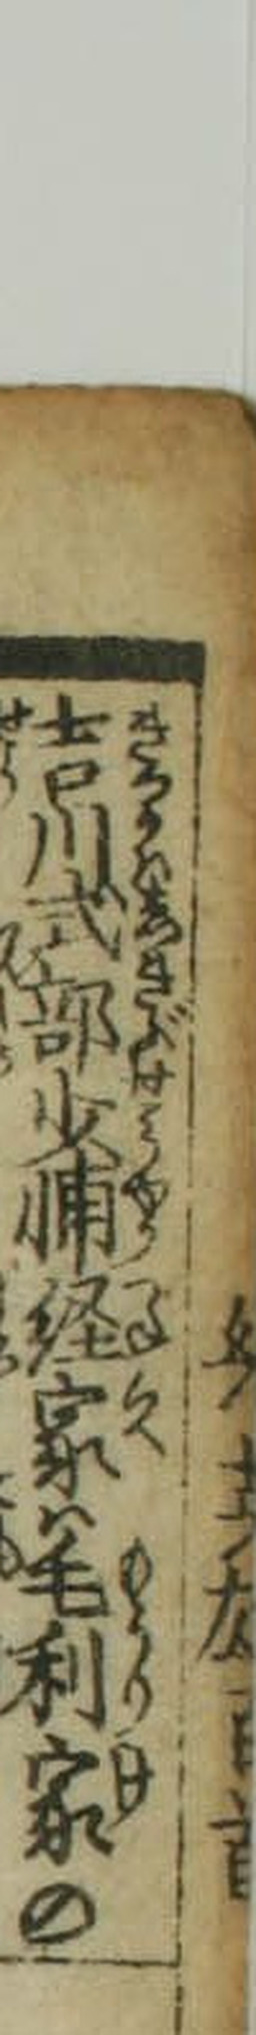吉川式部少輔経家は毛利家の
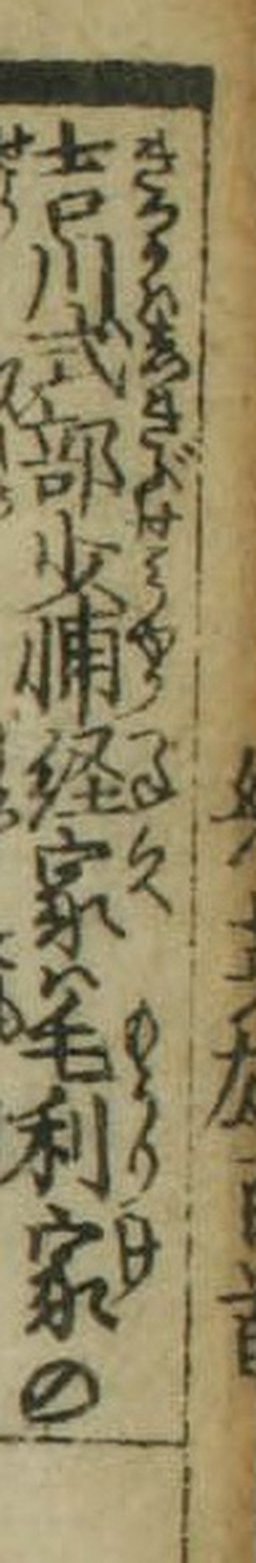吉川式部少輔経家は毛利家の
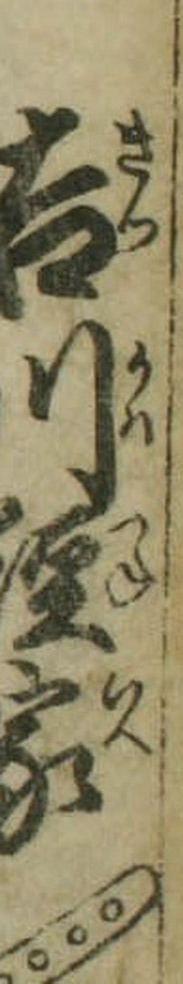吉川経家
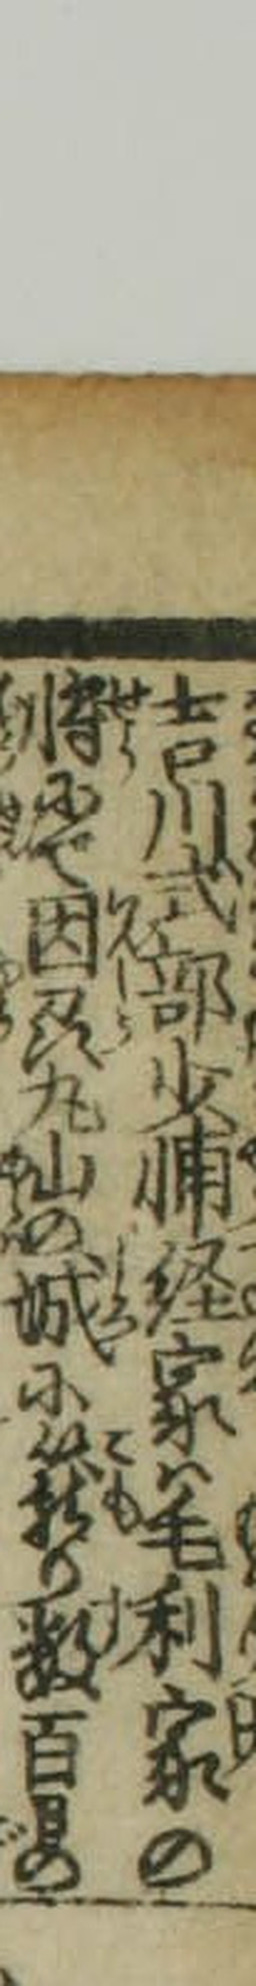将にて因州丸山の城に籠り数百日の
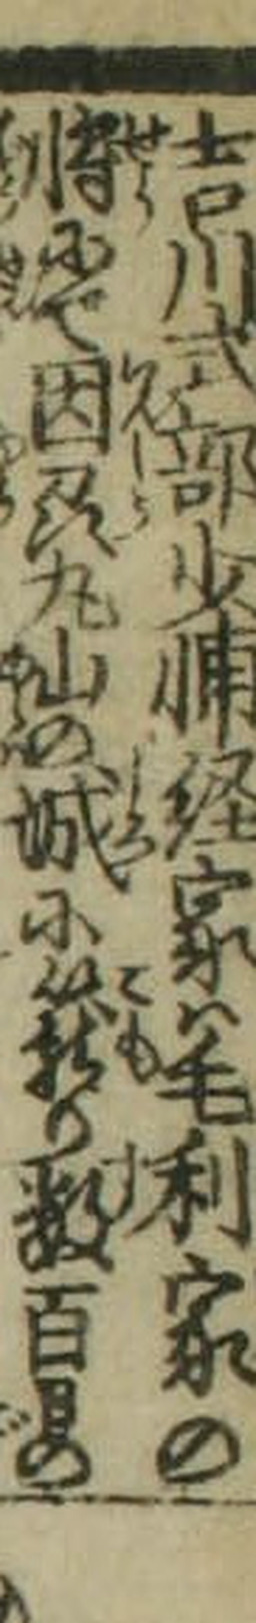将にて因州丸山の城に籠り数百日の
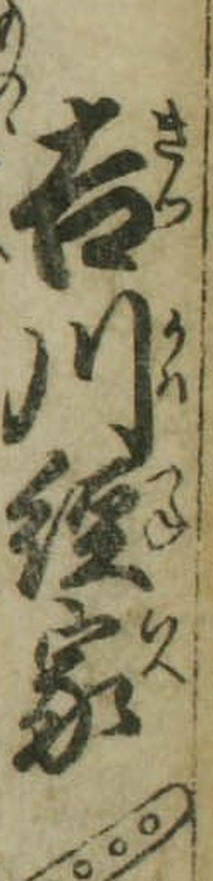吉川経家
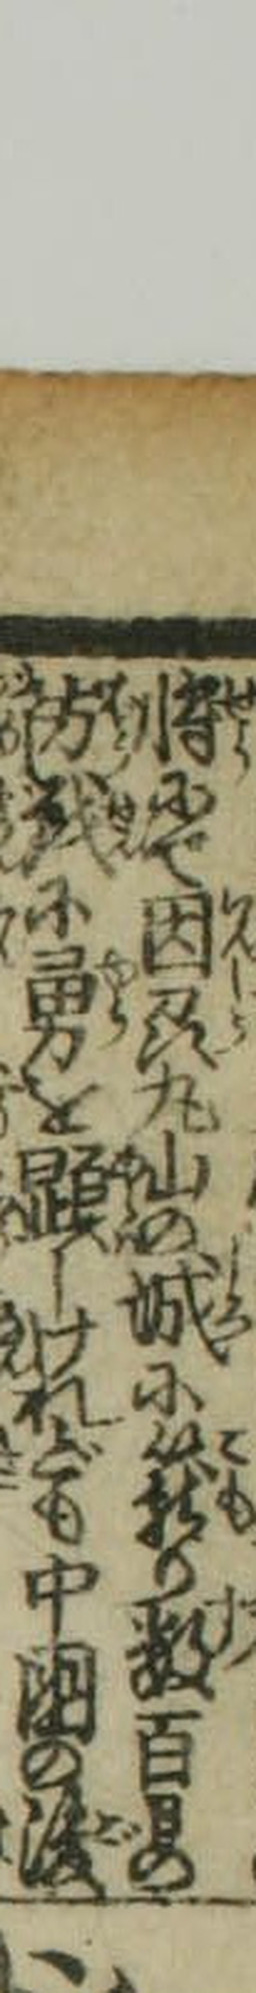防戦に勇を顕しけれども中国の後
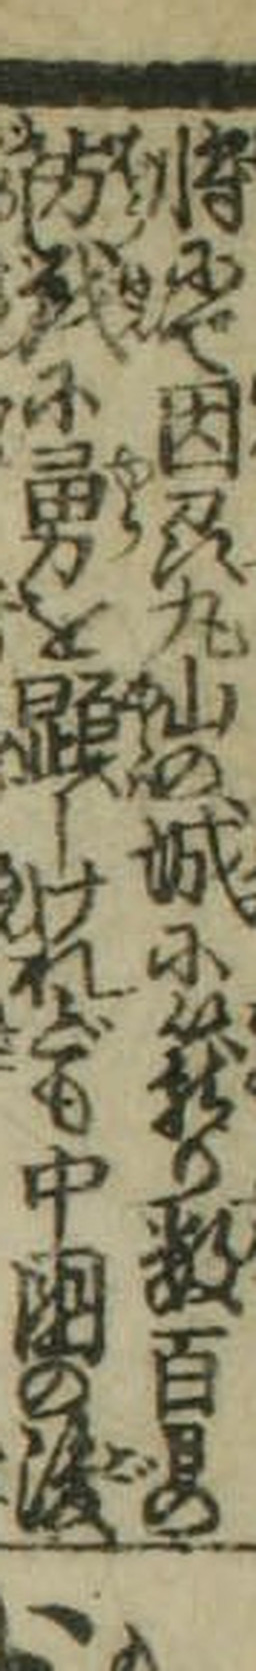防戦に勇を顕しけれども中国の後
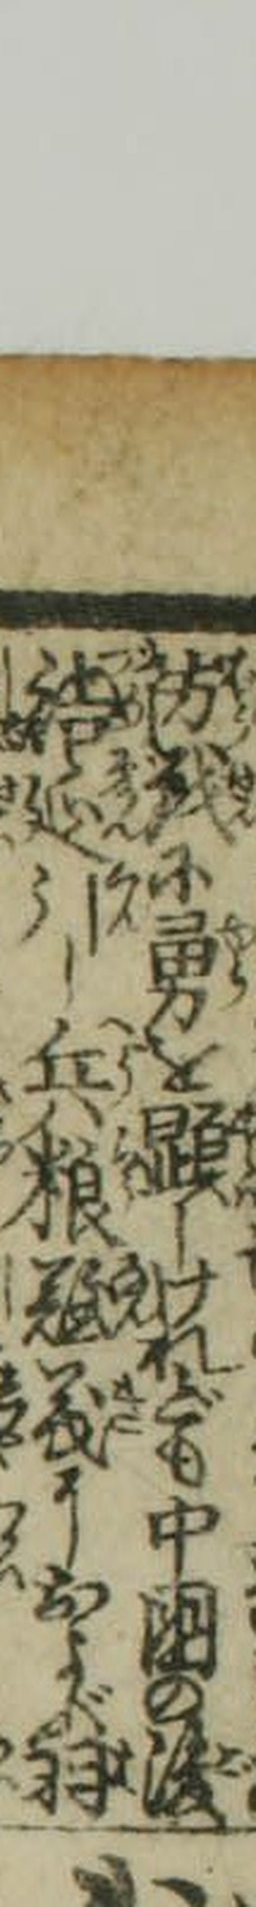詰延引し兵粮難義におよぶ羽
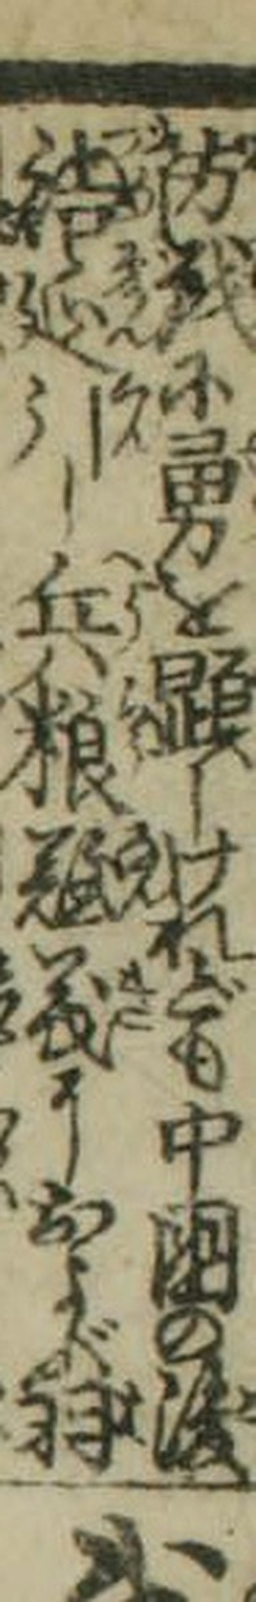詰延引し兵粮難義におよぶ羽
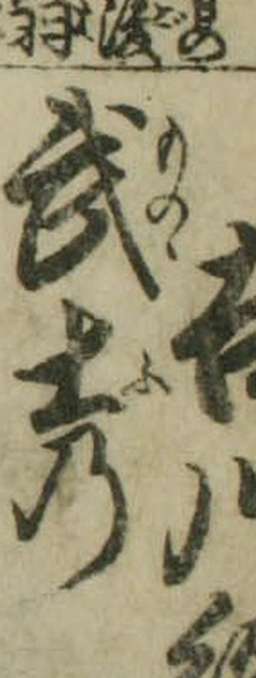武士の
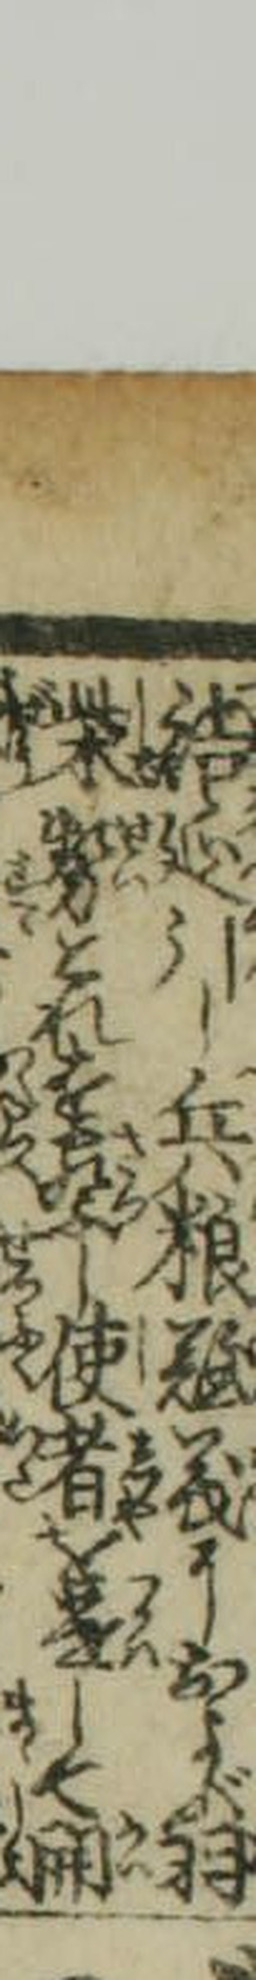柴勢これを察し使者を遣して開
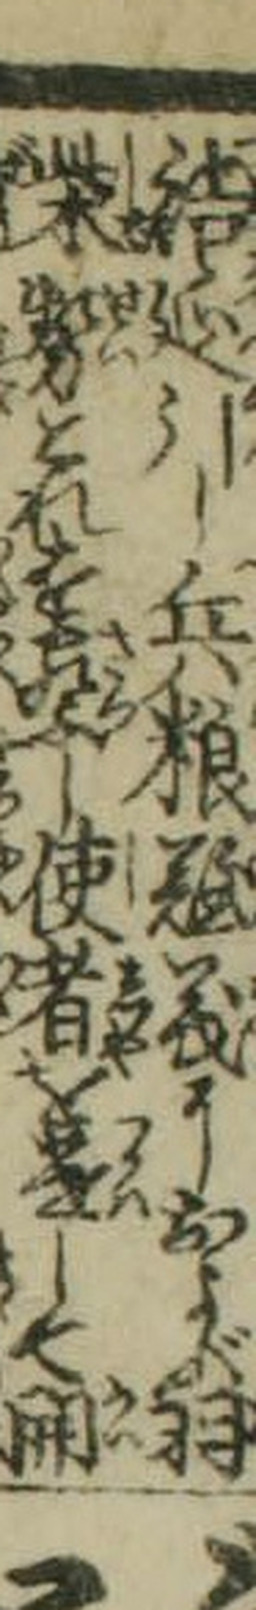柴勢これを察し使者を遣して開
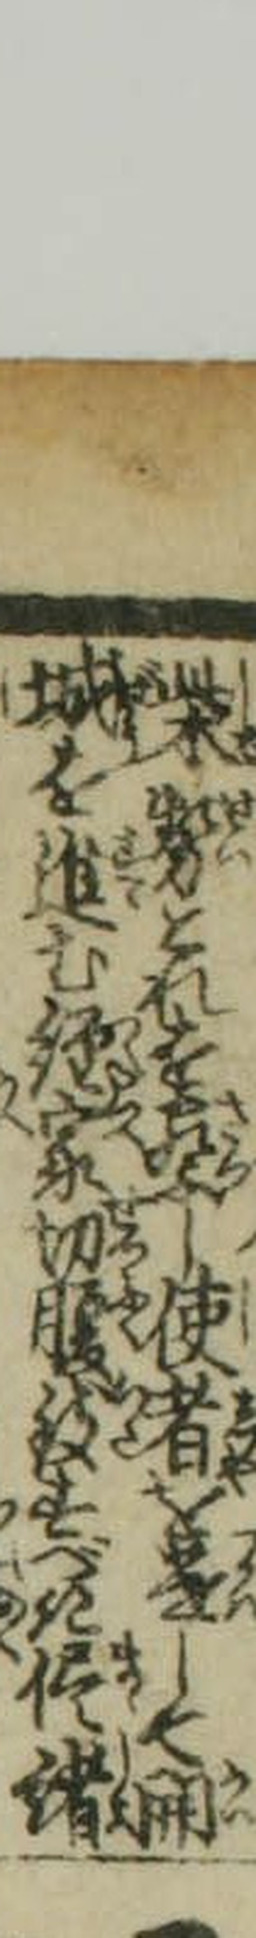城を進む経家切腹致すべき侭諸
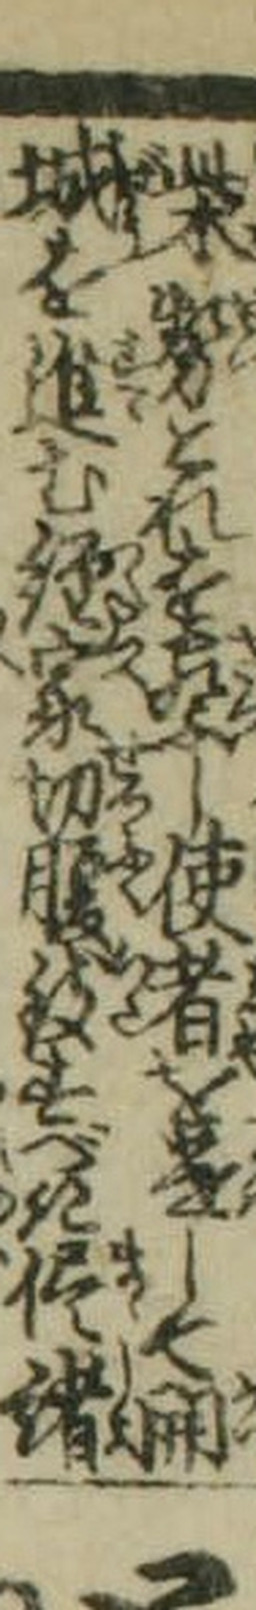城を進む経家切腹致すべき侭諸
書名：續英雄百人一首
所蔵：東京学芸大学附属図書館
